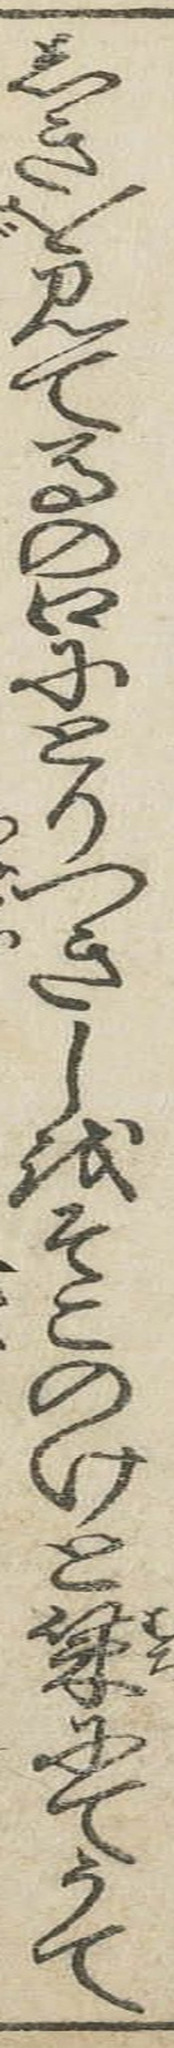しきを見て馬の口にとりつきしをそこのけと策にてうて
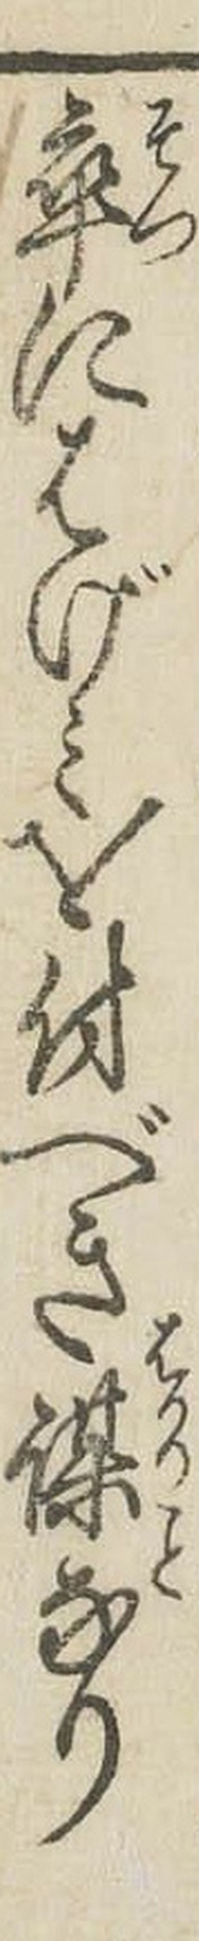卒にはげみを付べき謀なり
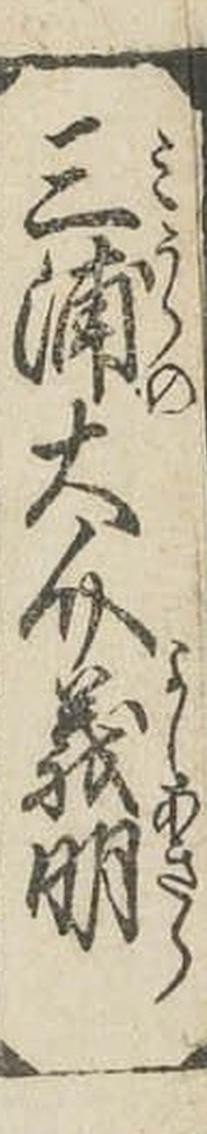三浦大介義明
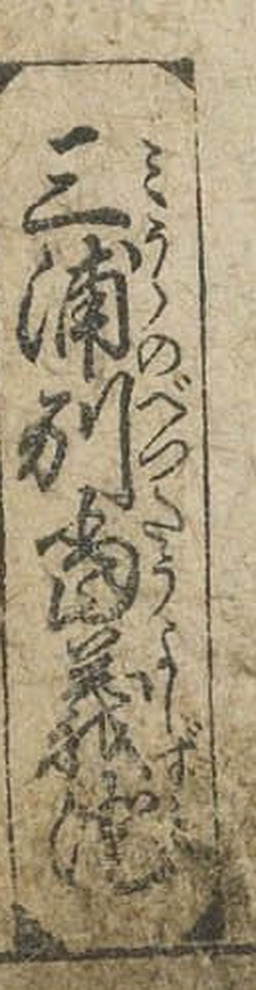三浦別当義澄

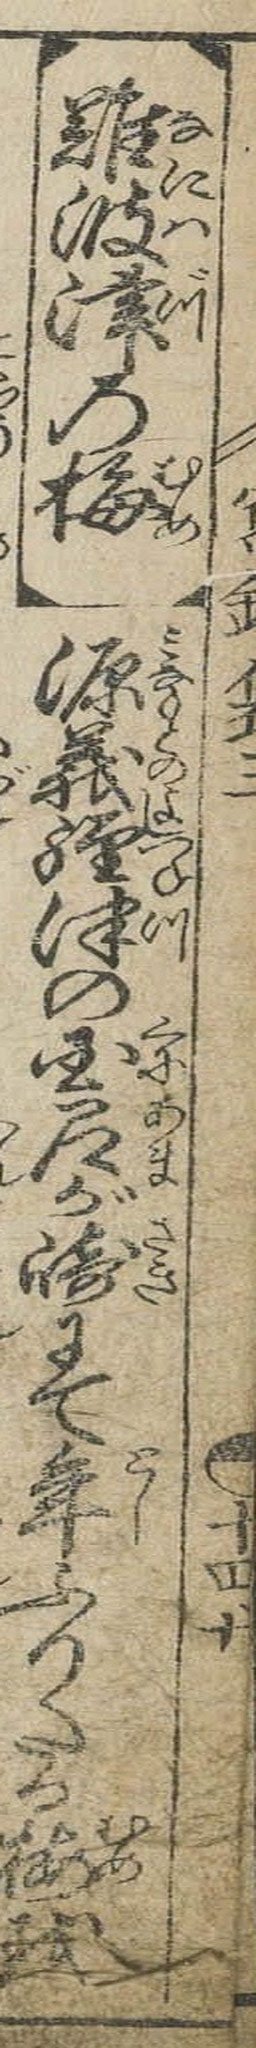難波津の梅源義経津の国尼が崎にて年ふりたる梅を
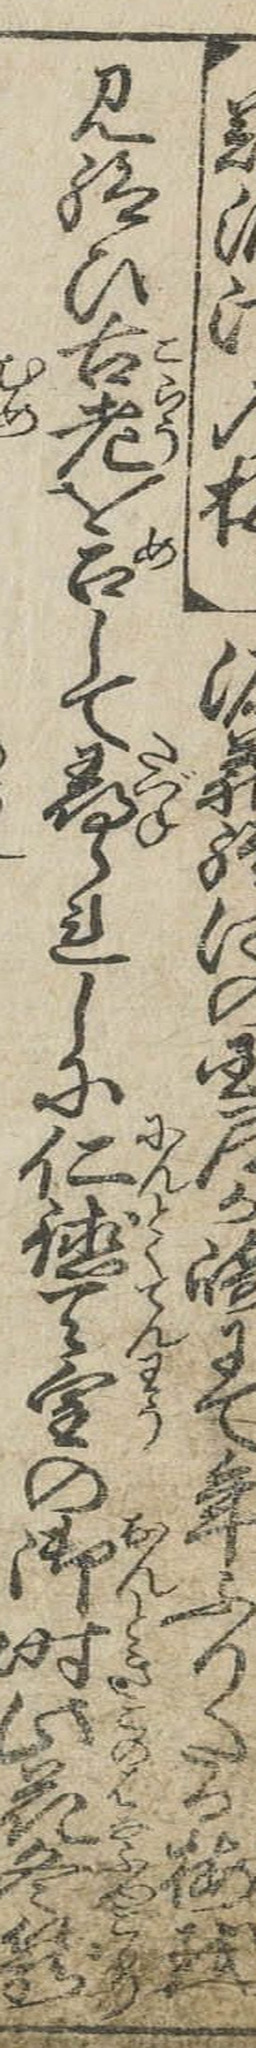見給ひ古老を召して尋られしに仁徳天皇の御時此花冬籠
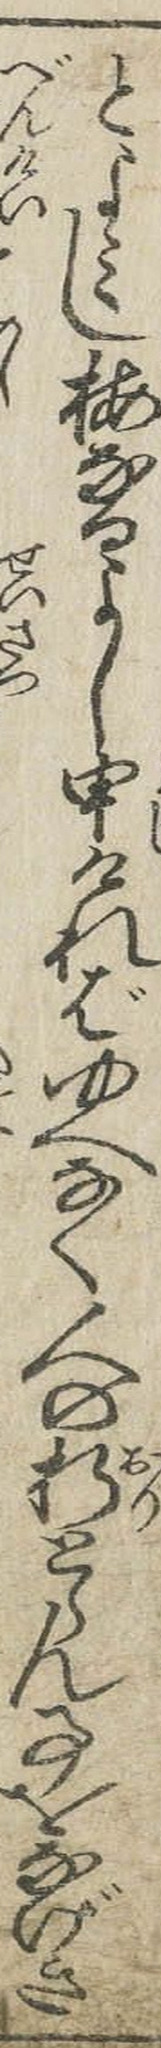とよみし梅なるよし申ければゆへなく人の折とらん事をなげき
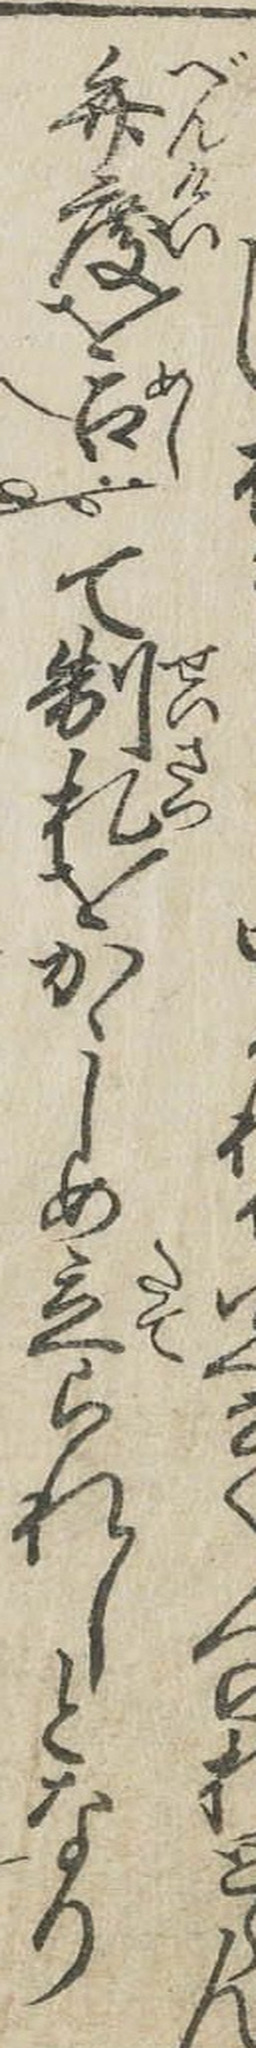弁慶を召て制札をかゝしめ立られしとなり
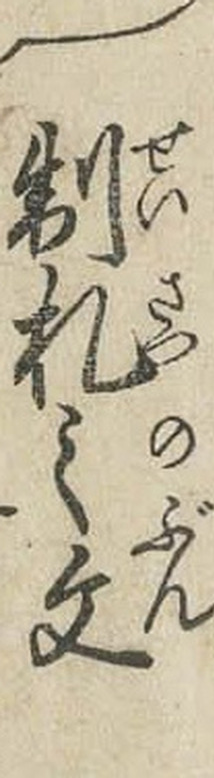制札之文

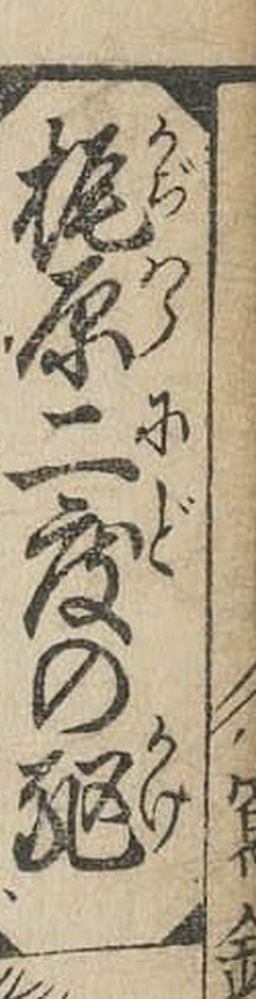梶原二度の駆
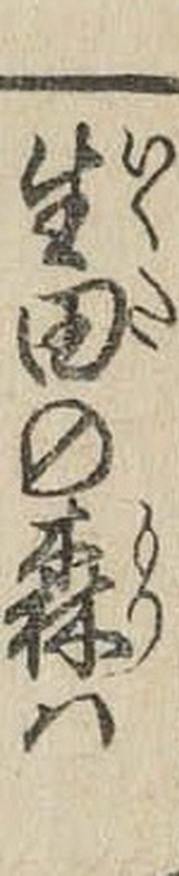生田の森は
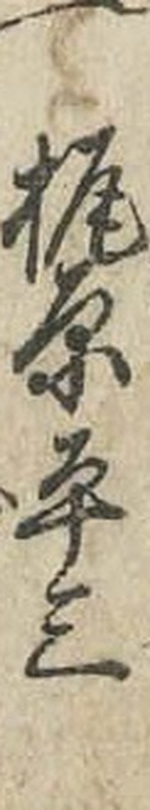梶原平三
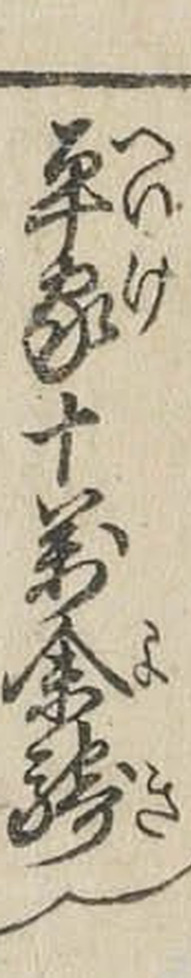平家十万余騎
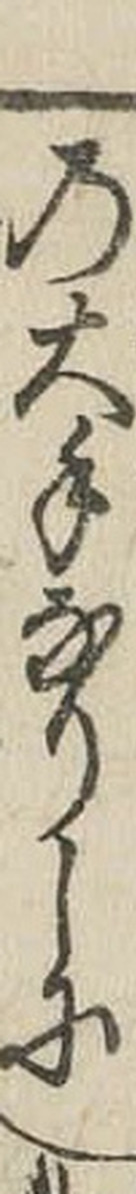の大手なりしに
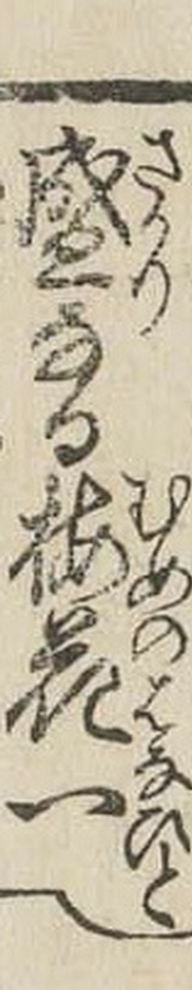盛なる梅花一
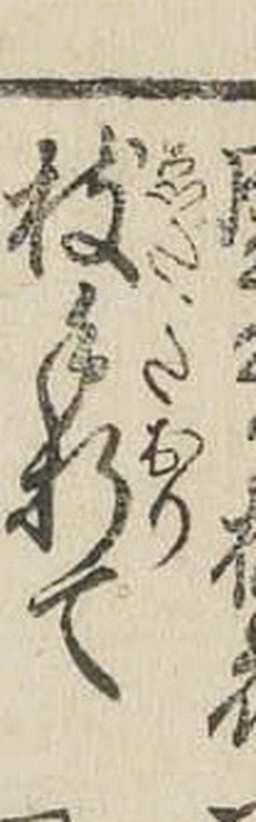枝手折て
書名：絵本写宝袋 9巻 3之巻
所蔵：東京学芸大学教育コンテンツアーカイブ
